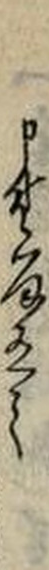申付候留有之
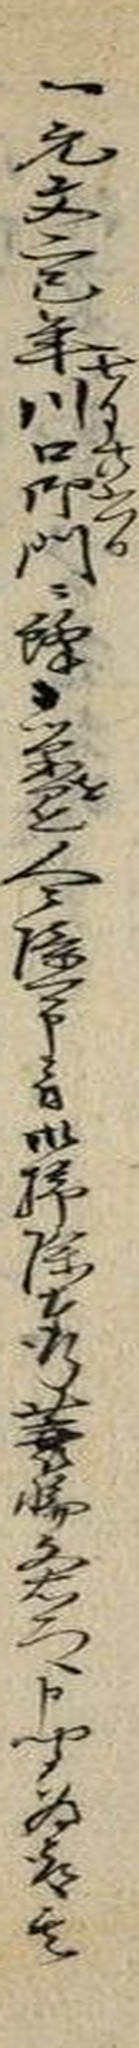一元文二己年七月廿六日川口御門に蜂巣を懸人々障可申に付御掃除奉行蓑輪文右衛門へ申聞為取其
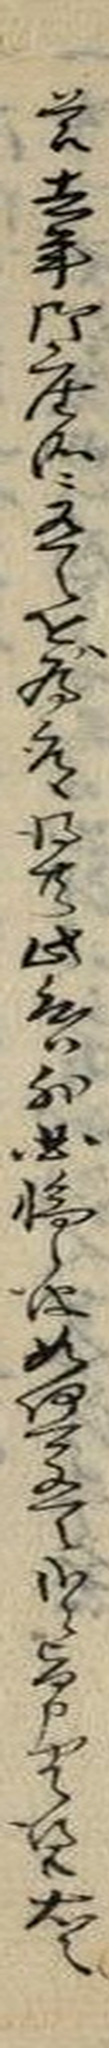節去年御座所に有之をハ為取候得共此度は外曲輪之儀如何可有之哉之旨申聞候得共右之
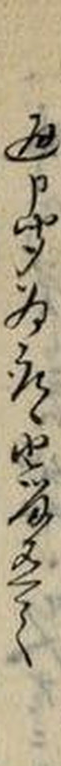通申聞為取候由留有之
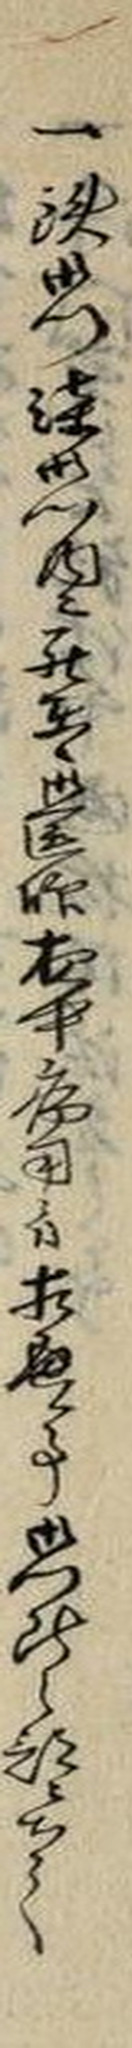一鉄御門漆御門内に罷在候御医師夜中病用に付相通候事御門断之部に出之
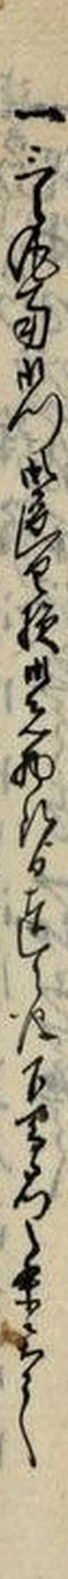一三之丸南御門御道具損御先物頭ゟ達之儀下馬御門之条に出之
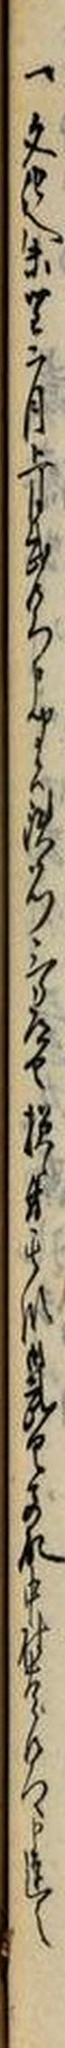一文化八未閏二月上月武左衛門申聞候は鉄御門三ツ道具損候に付其段御武具支配中村太郎左衛門へ申達之
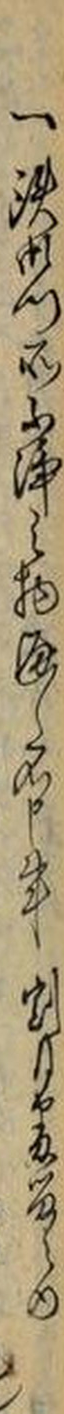一鉄御門所不浄之物通し不申事割月番留之内
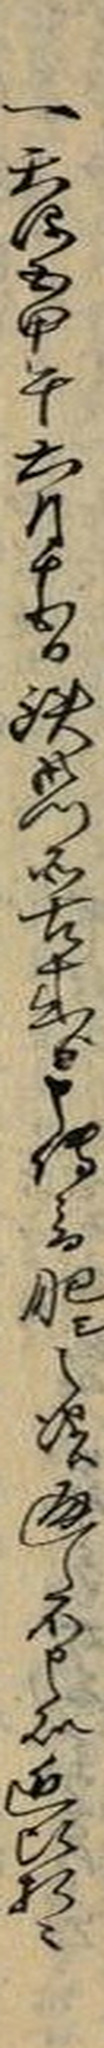一天保五甲午六月十五日鉄御門所古来ゟ申伝に而肥し之儀は通し不申候所近頃折々
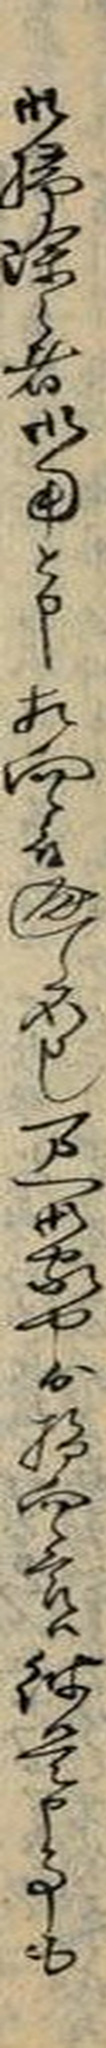御掃除之者御用と申相向候に付通し不申候万一御家中ゟ指向候節は彼是申事も
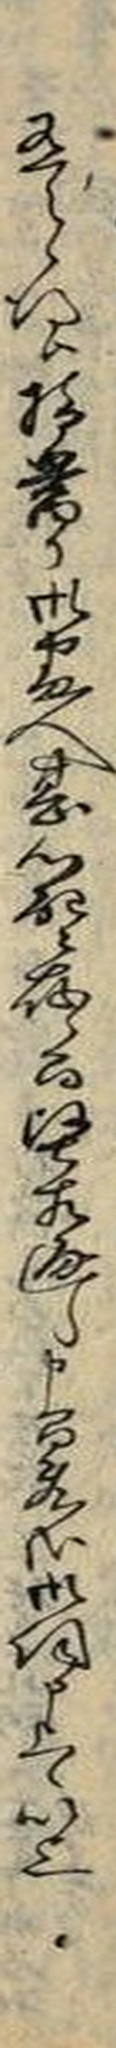有之候得は指当り御番人甚心配に存候間堅相通し申間敷哉御伺申上候以上
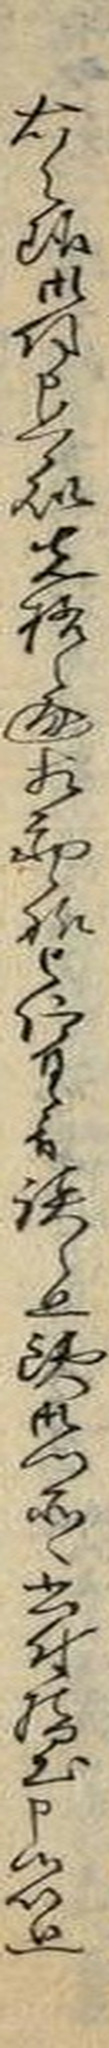右之趣御伺申上候処先格之通相勤候様被仰付候に付談之上鉄御門所へ書付指出申候以上
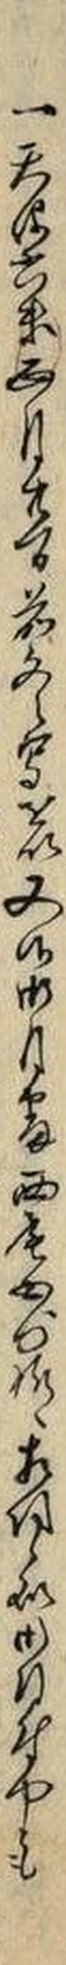一天保六未正月廿一日前文之写を以又候御月番西尾五右衛門様へ相伺候処御目付中にも
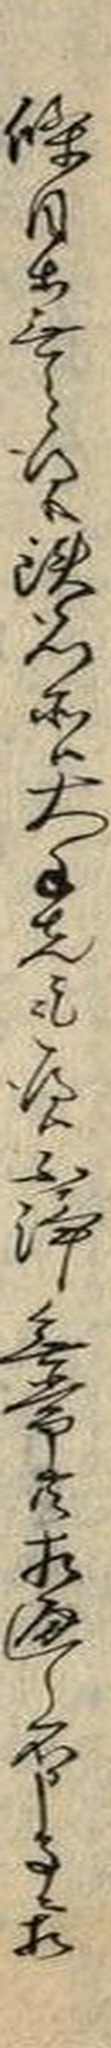条目等無之候得共鉄御門所は大手先にも候得は不浄無常共相通し不申事に相
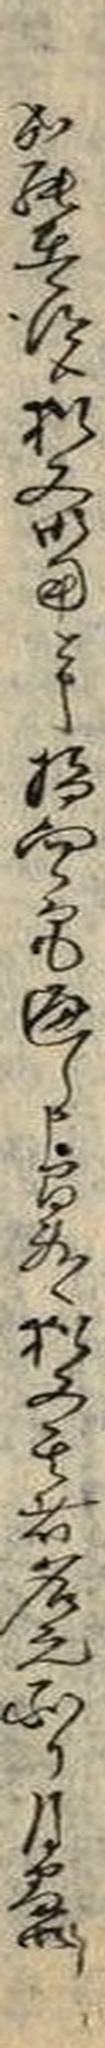成罷在候得は猶又御用と申指向候而も通し申間敷候猶又其者名元承り月番御
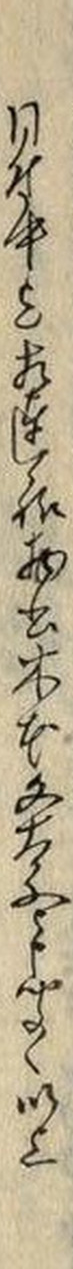目付中迄相達候様物書木本文太夫被申聞候以上
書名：御門御櫓之部
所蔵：福井県文書館 Fukui Prefectural Archives
